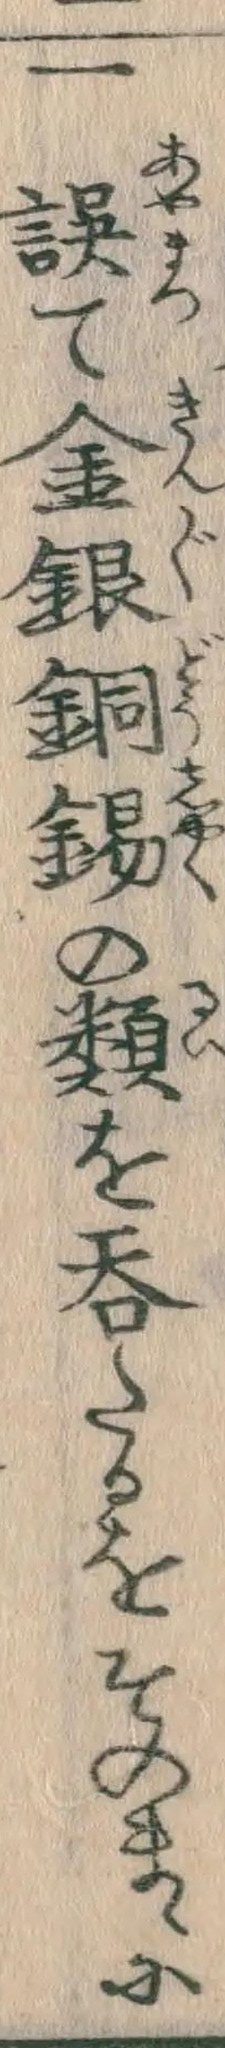一誤て金銀銅錫の類を吞たるをそのまゝに
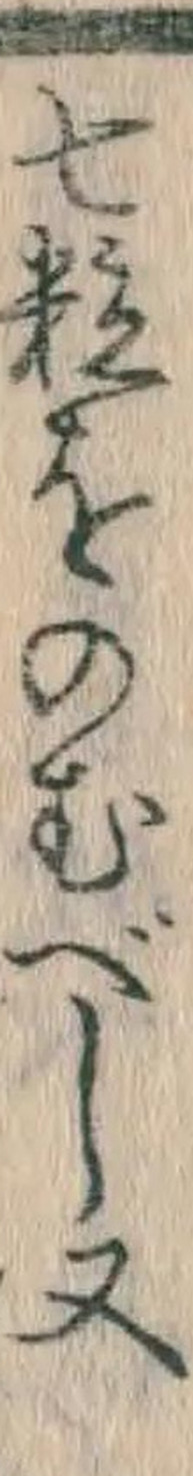七粒をのむべし又
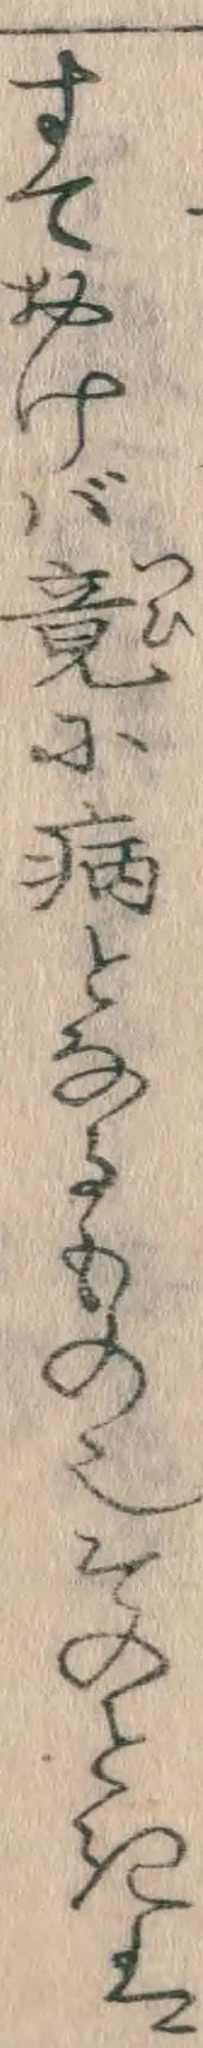すておけば竟に病となるもの也そのときは
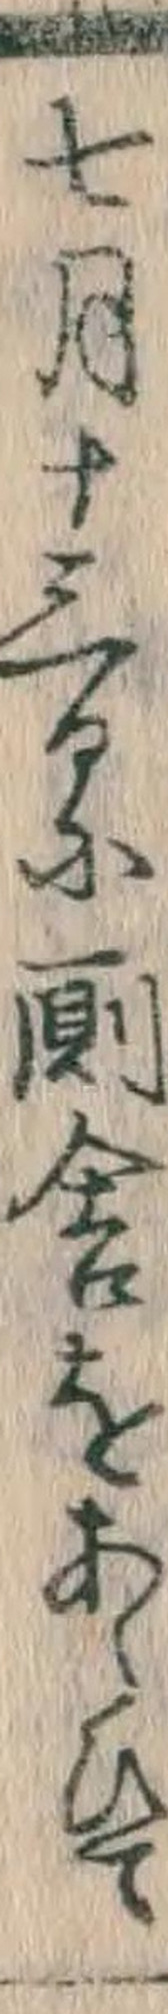七月十三日に厠舎をあらひて
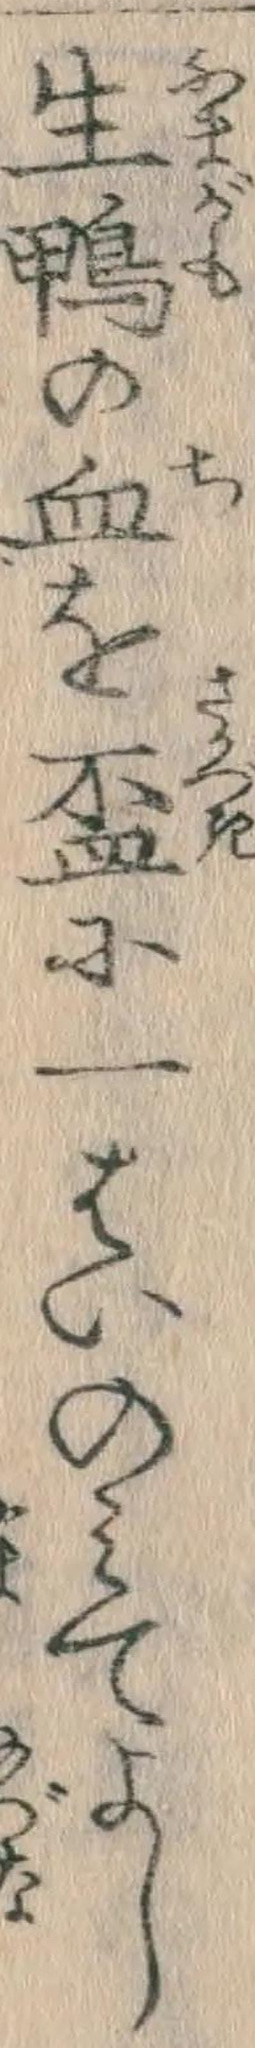生鴨の血を盃に一はいのみてよし
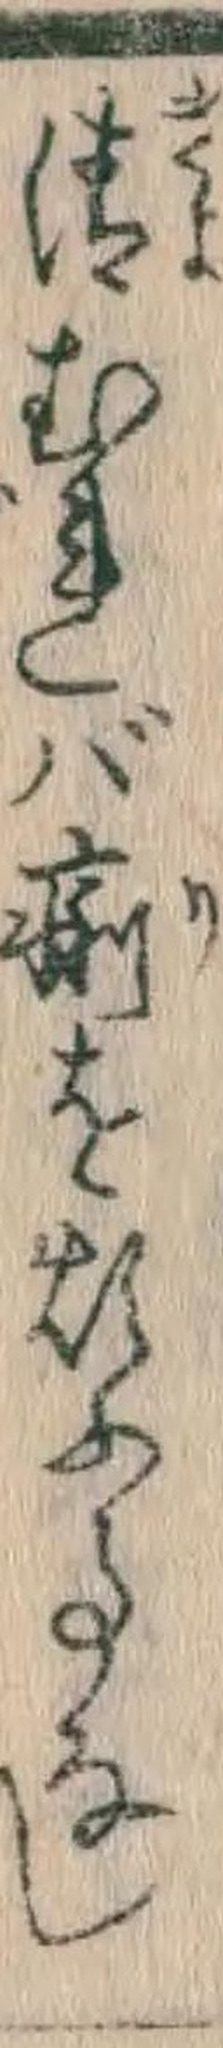清むれば痢を煩ふ事なし
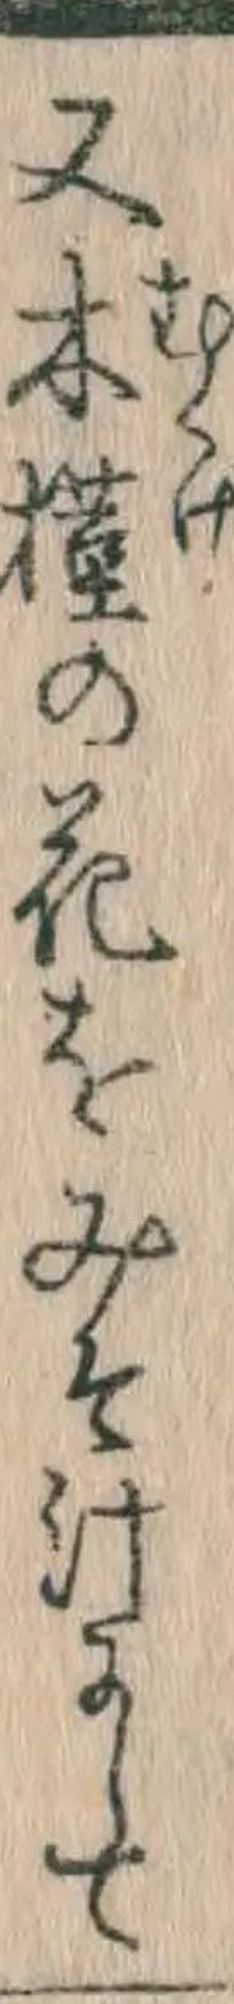又木槿の花をみそ汁にして
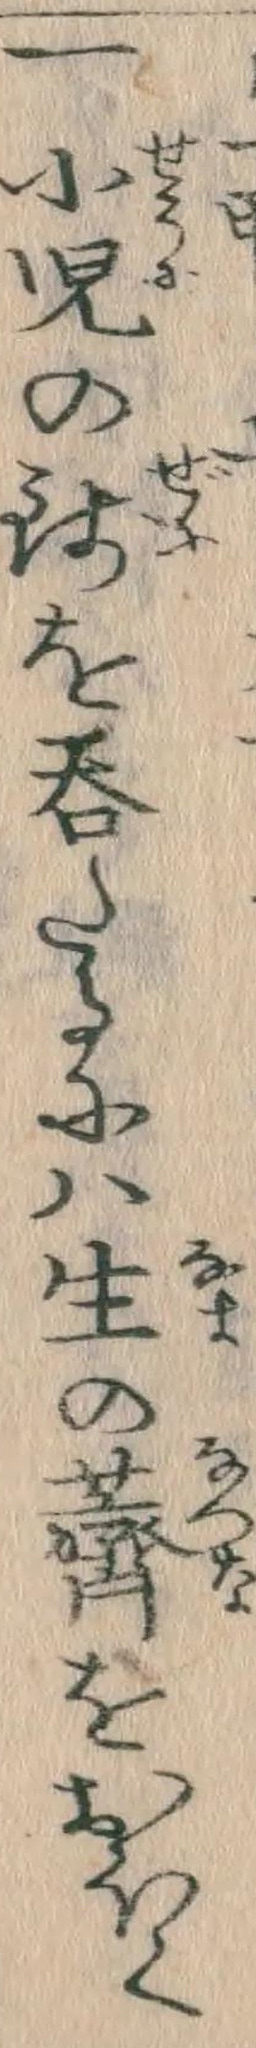一小児の銭を吞たるには生の薺をおほく
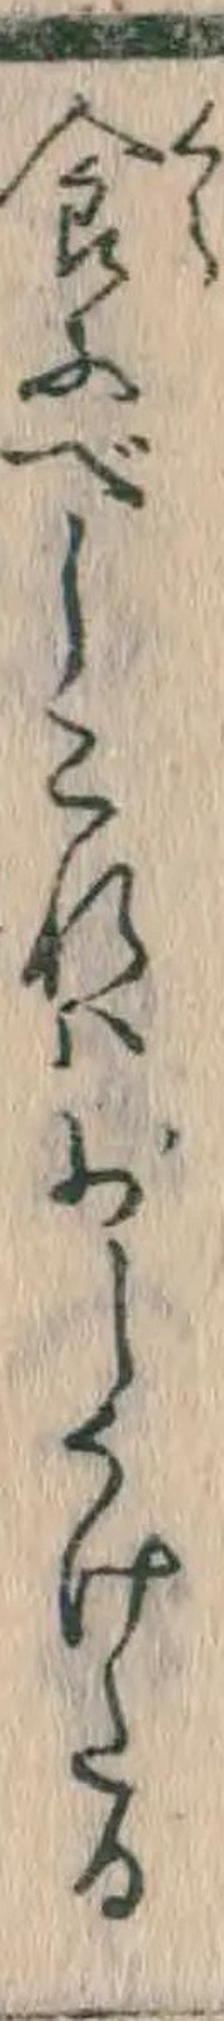食ふべしこれは少しかけたる
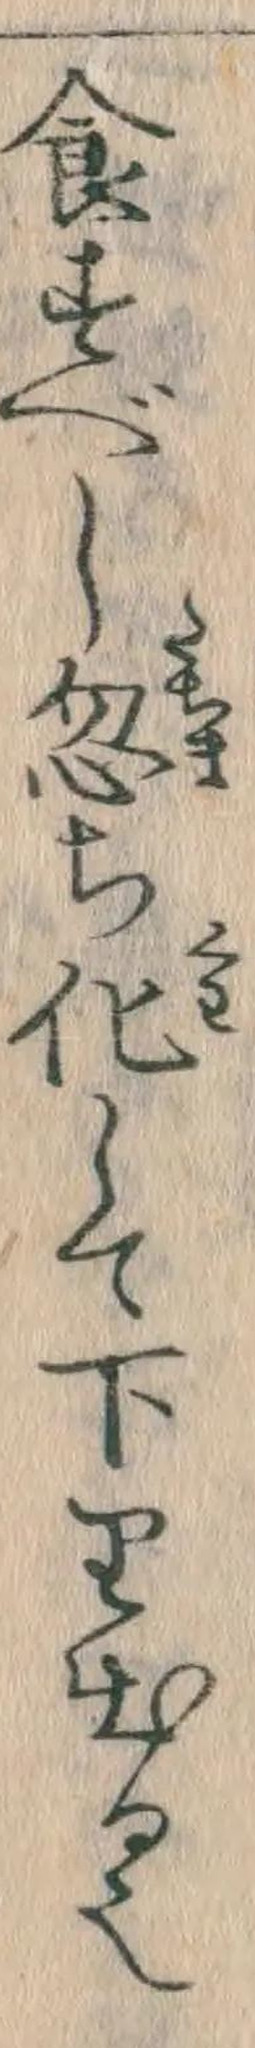食すべし忽ち化して下り出る也
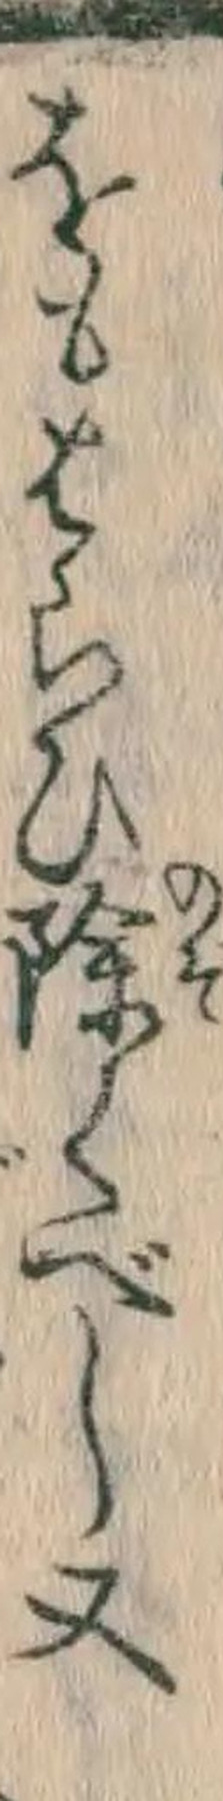をもはらひ除くべし又
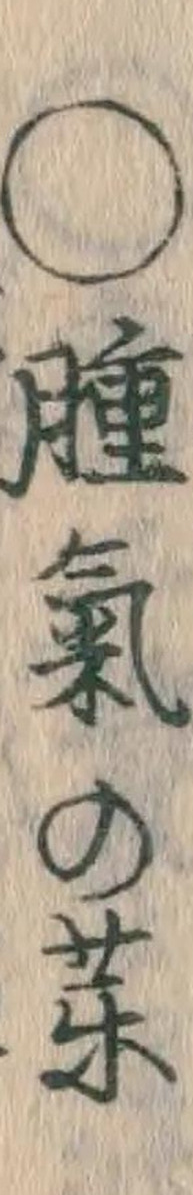○腫気の薬
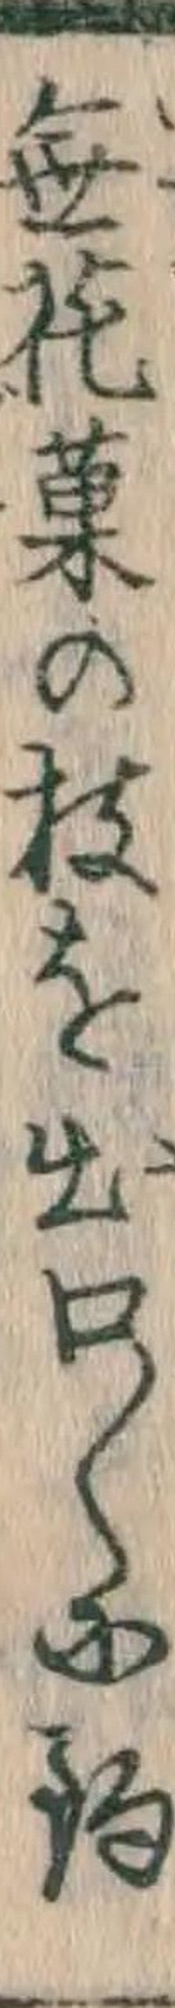無花果の枝を出口〳〵に釣
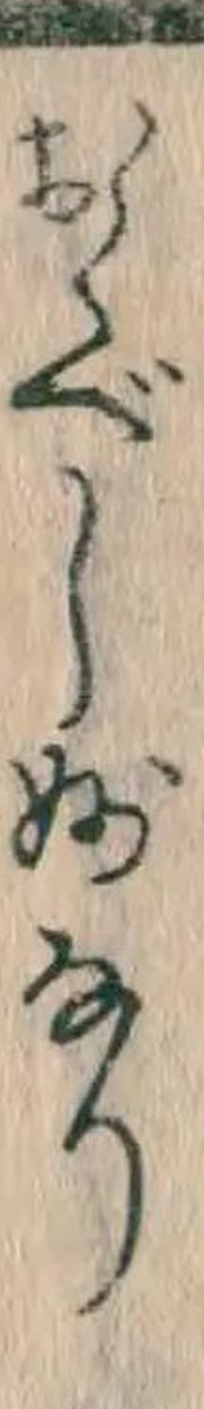おくべし妙なり
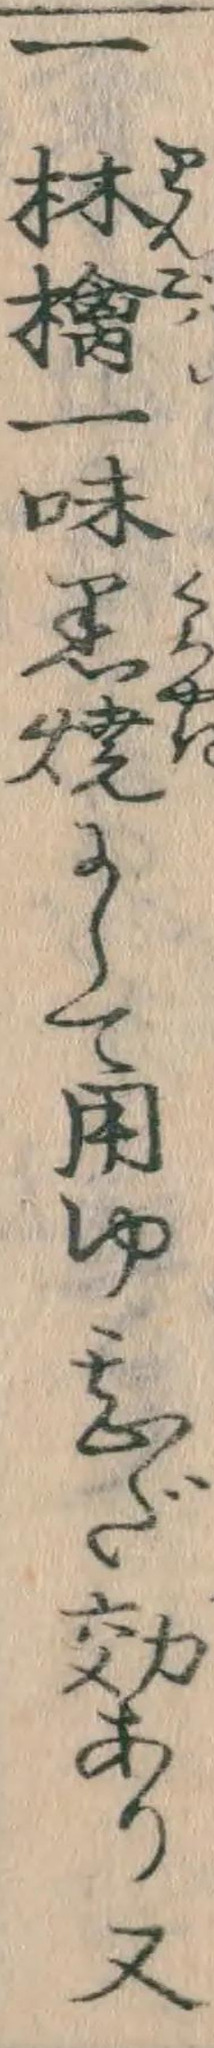一林檎一味黒焼にして用ゆ甚だ効あり又
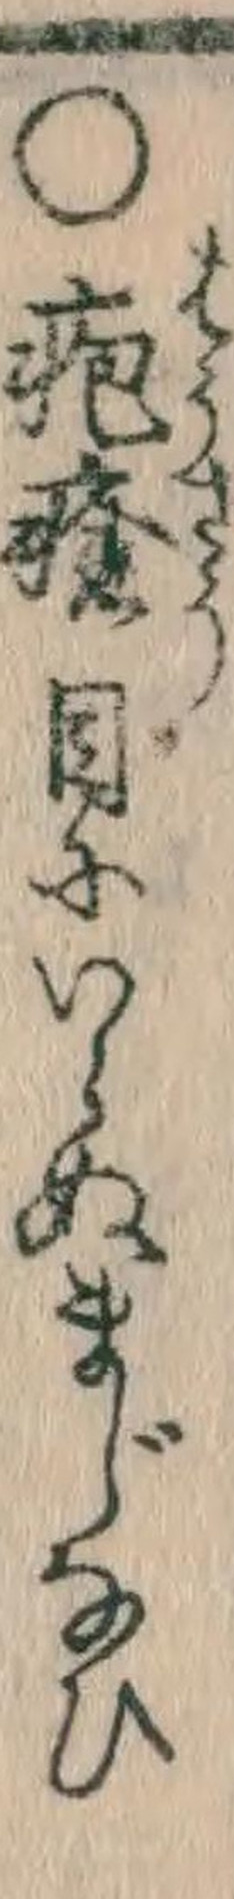○疱瘡目にいらぬまじなひ
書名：広益秘事大全 3巻. [4]
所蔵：国立国会図書館 National Diet Library, JAPAN
